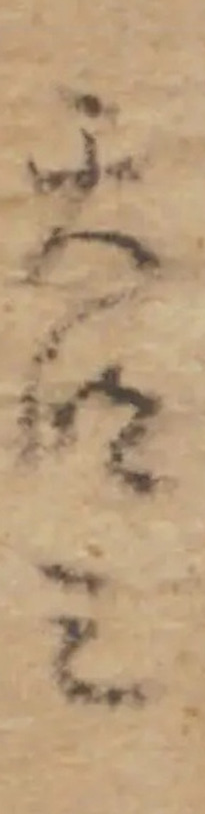天明三

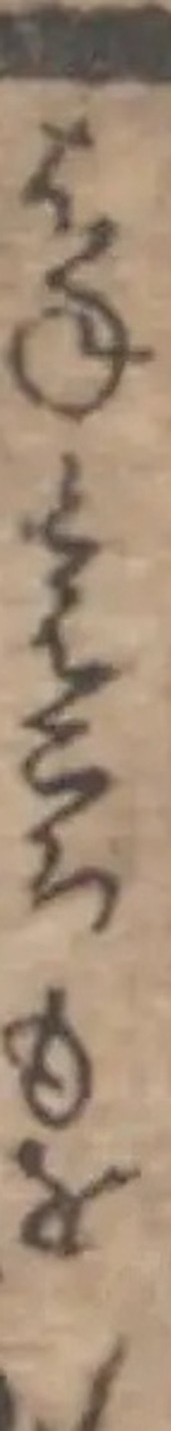はねとはころもを
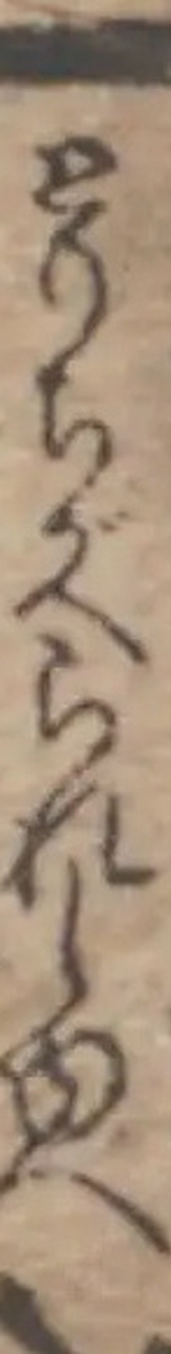とりちがへられしゆへ
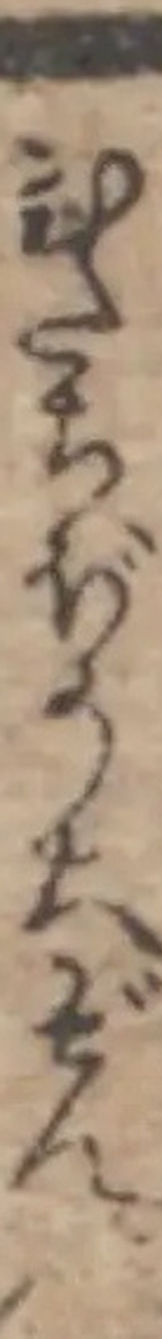ひたちぼう大ぞん
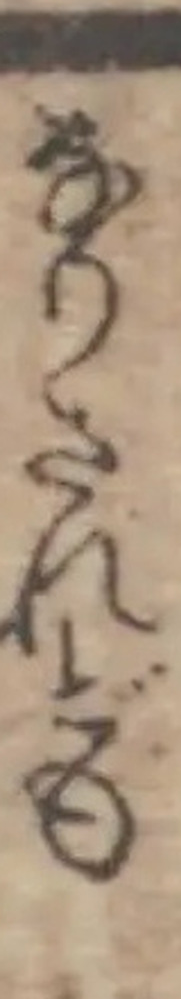なりされども
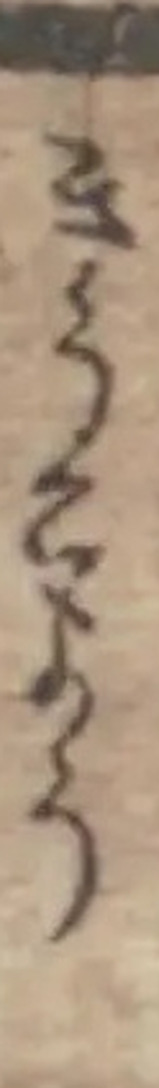きうこよう
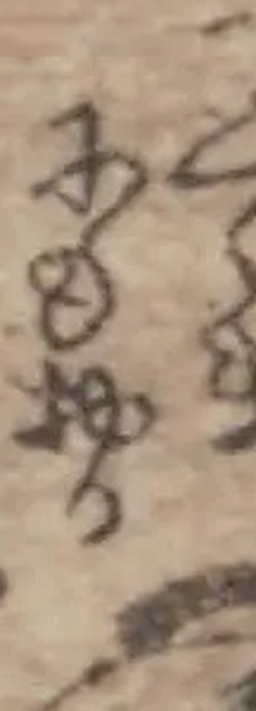にもおか
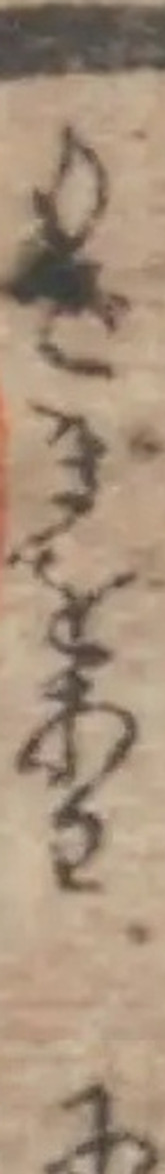もでまをあわ
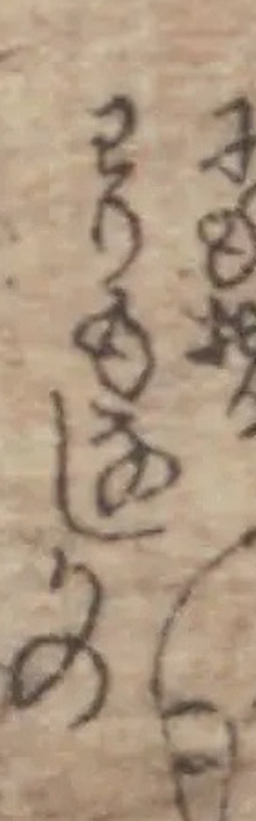わりもなしかの
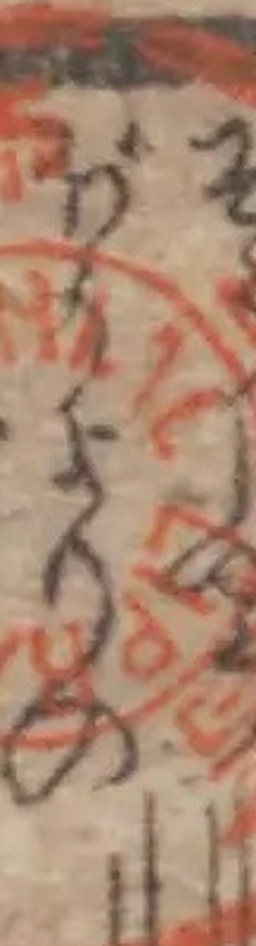ぼうよりの
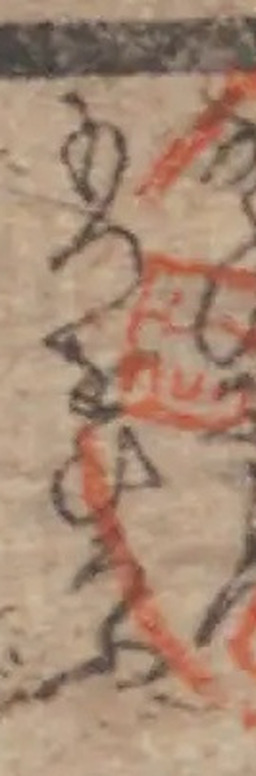もつをひろふ
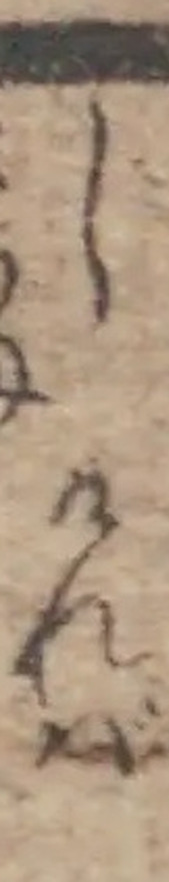しけれバ
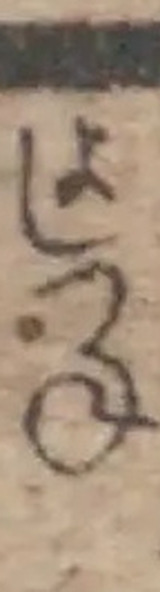よしつね
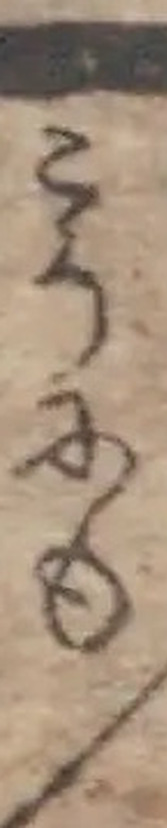こうにも
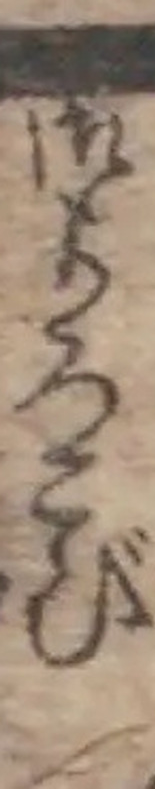御よろこび
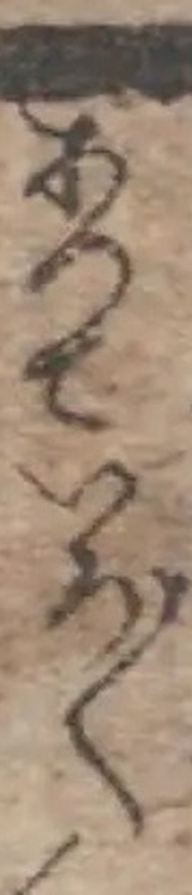あつていろ〳〵
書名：草紙の曙 3巻
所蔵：国立国会図書館 National Diet Library, JAPAN
